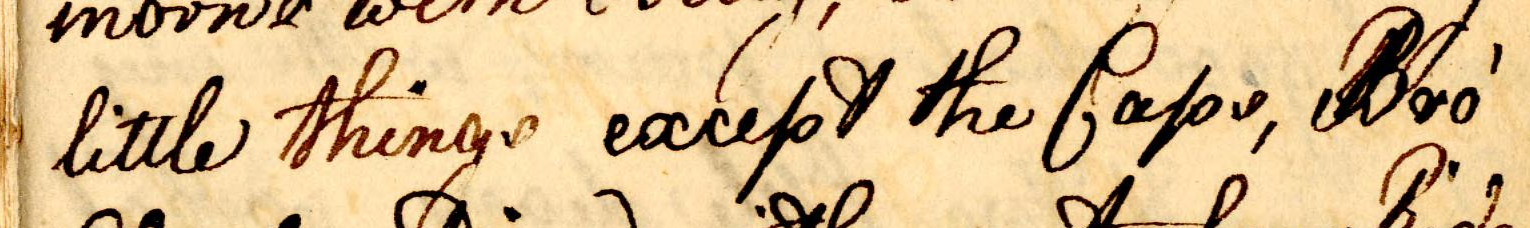little things except the Caps, Bro'
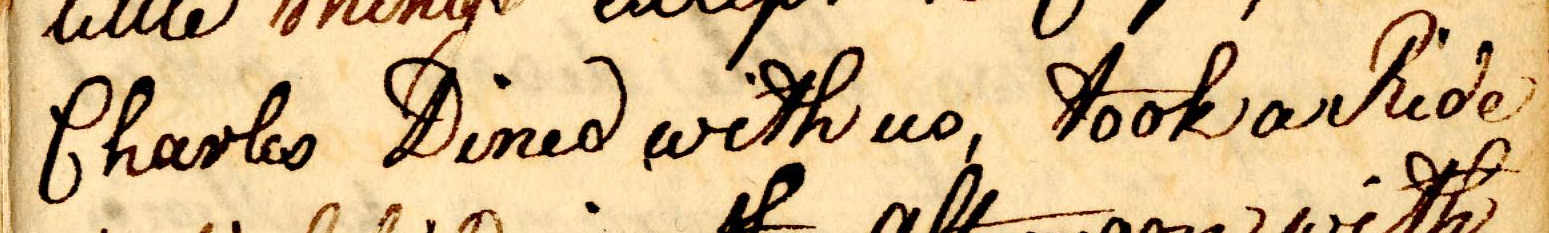Charles Dined with us, took a Ride
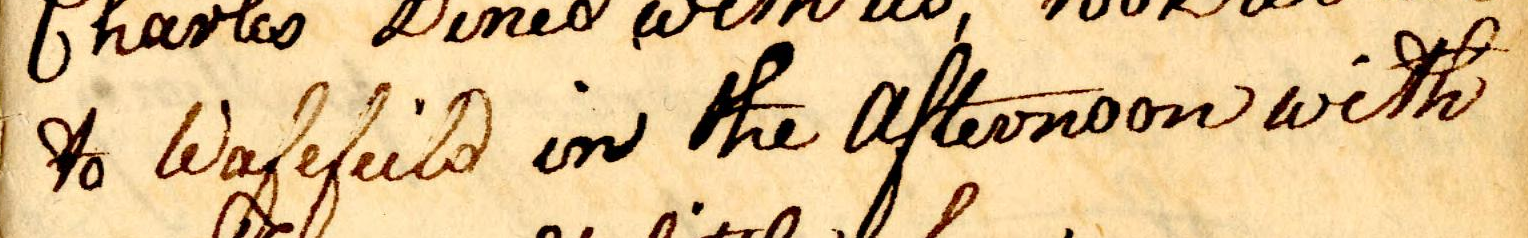to Wafefeild in the Afternoon with
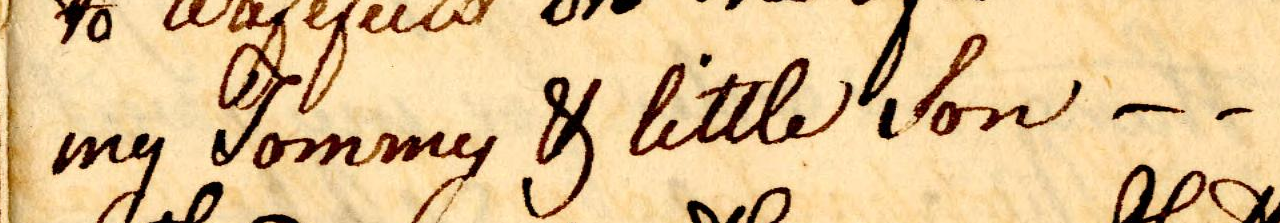my Tommy & little Son-
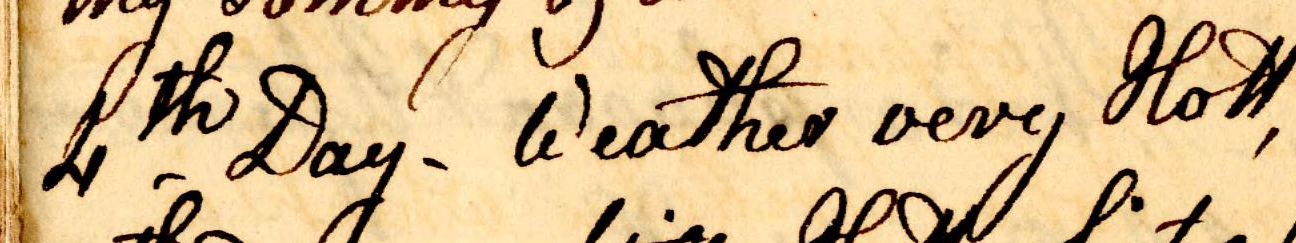4^th Day- Weather very Hott,
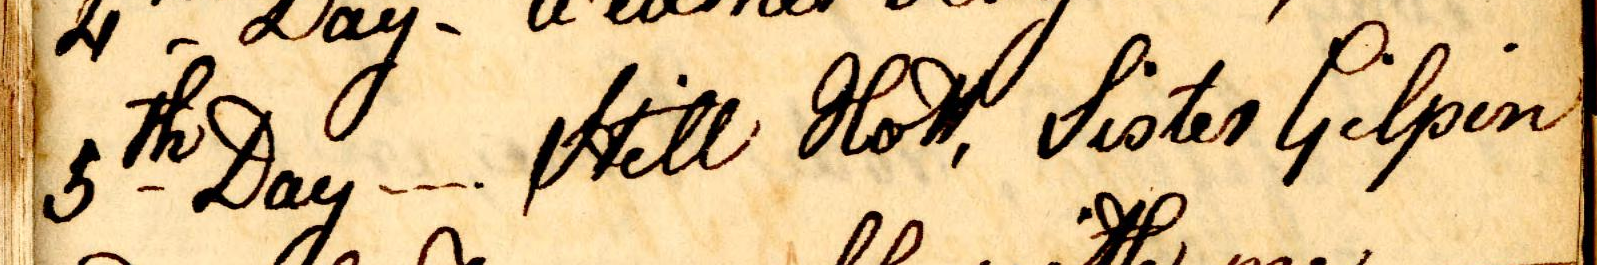5^th Day- Still Hott, Sister Gilpin
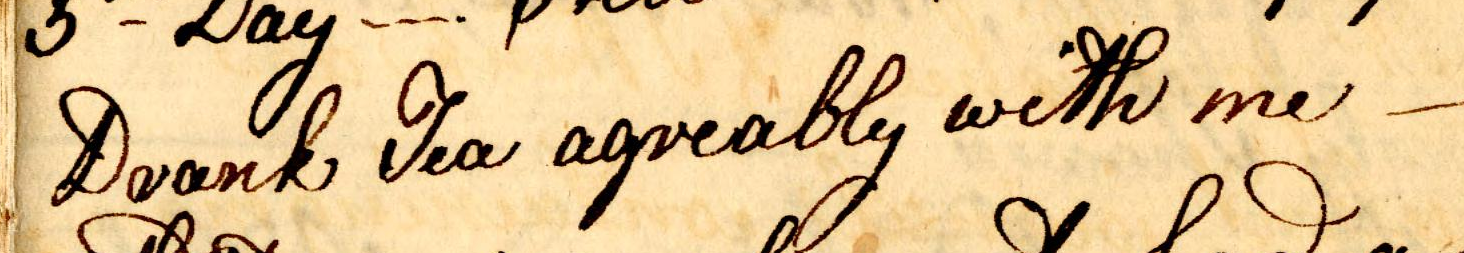Drank Tea agreably with me
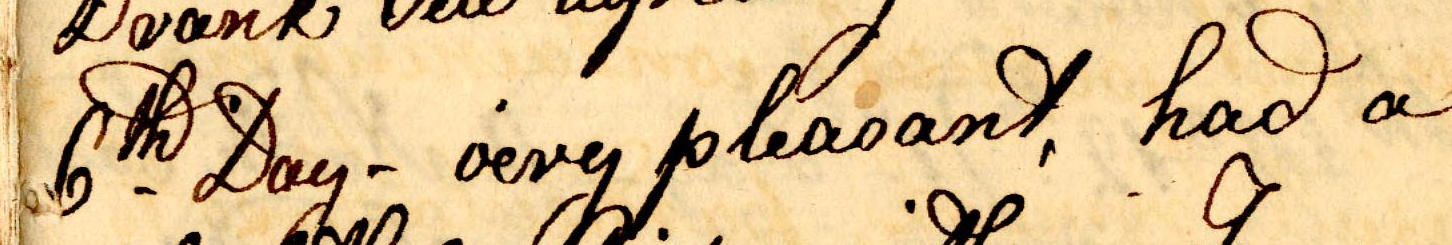6^th Day- very pleasant, had a
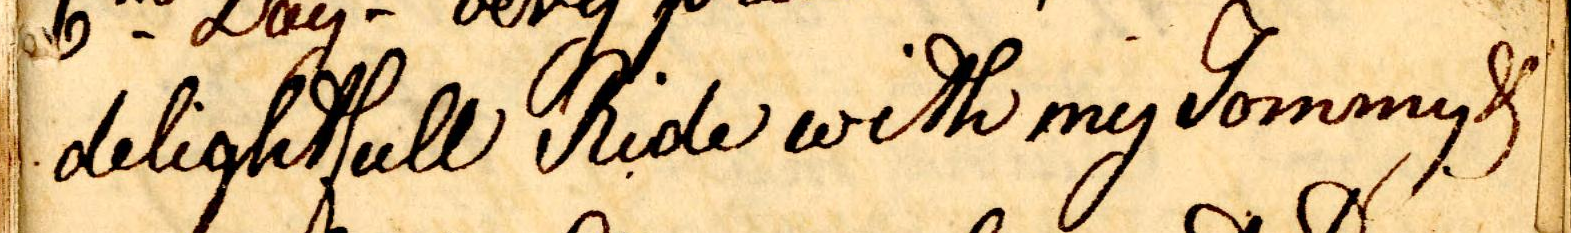delightfull Ride with my Tommy &
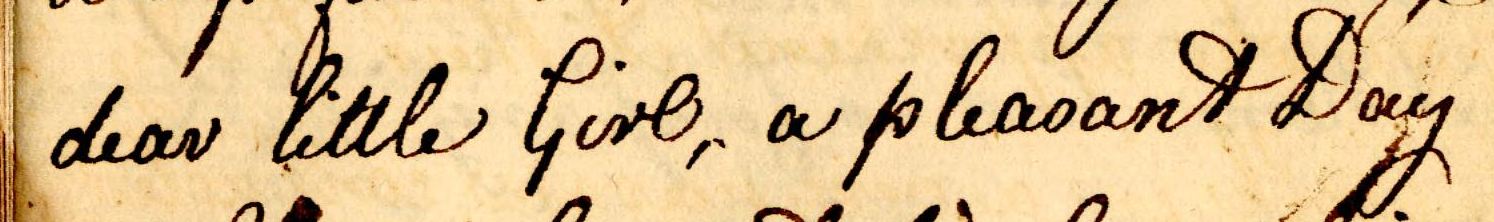dear little Girl, a pleasant Day
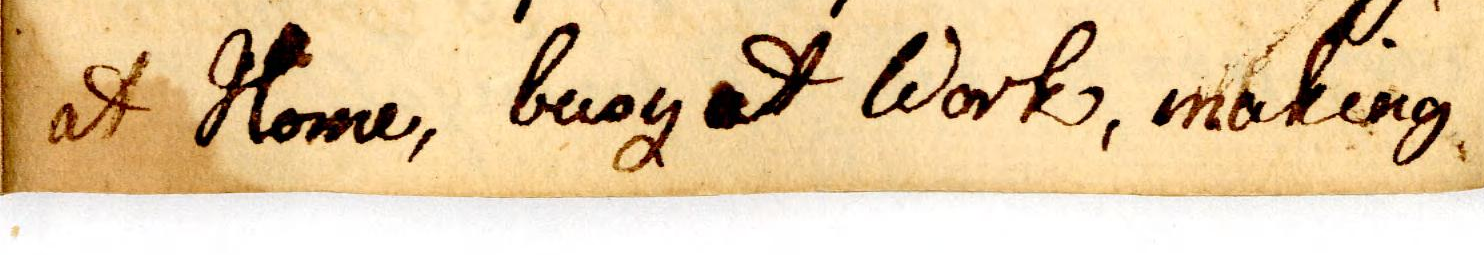at Home, busy at Work, making
